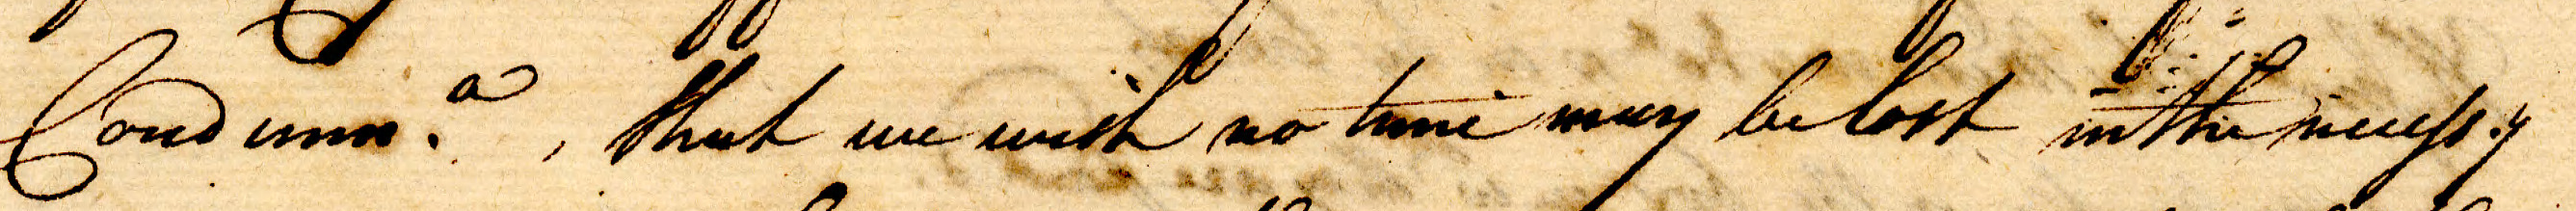Condumn^a., that we wish no time may be lost in the necess.y
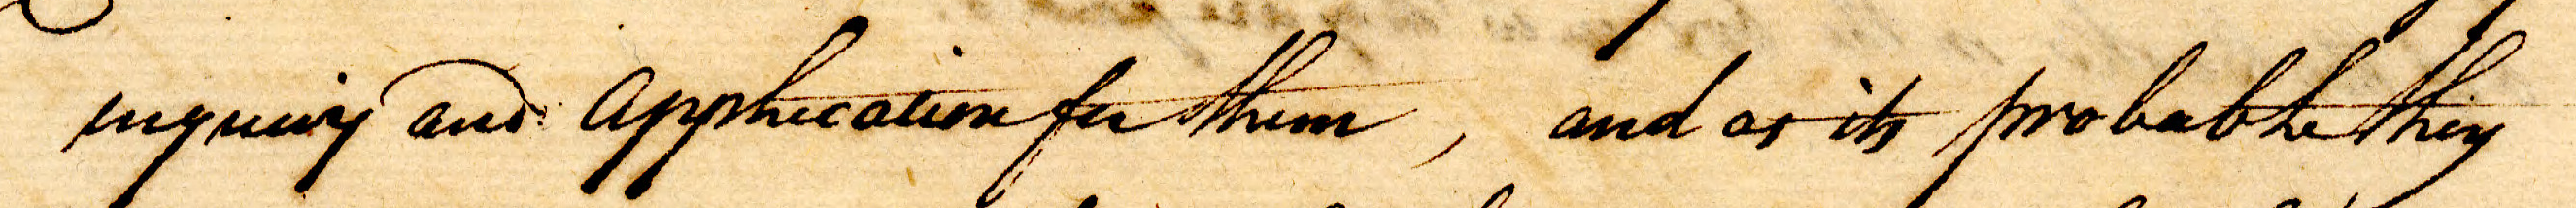enquiry and application for them, and as its probable they
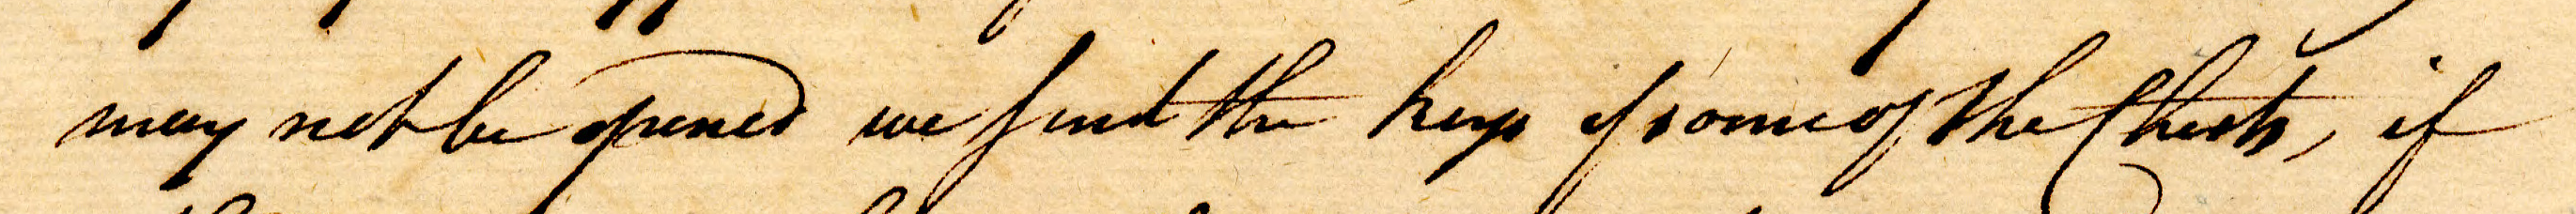may not be opened we find the keys of some of the Chests, if
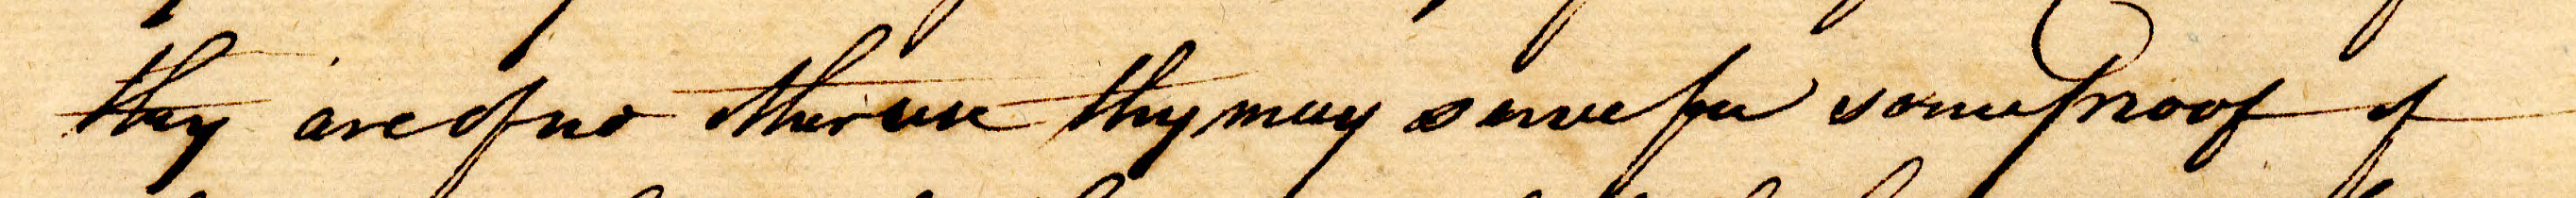they are of no other use they may serve for some proof of
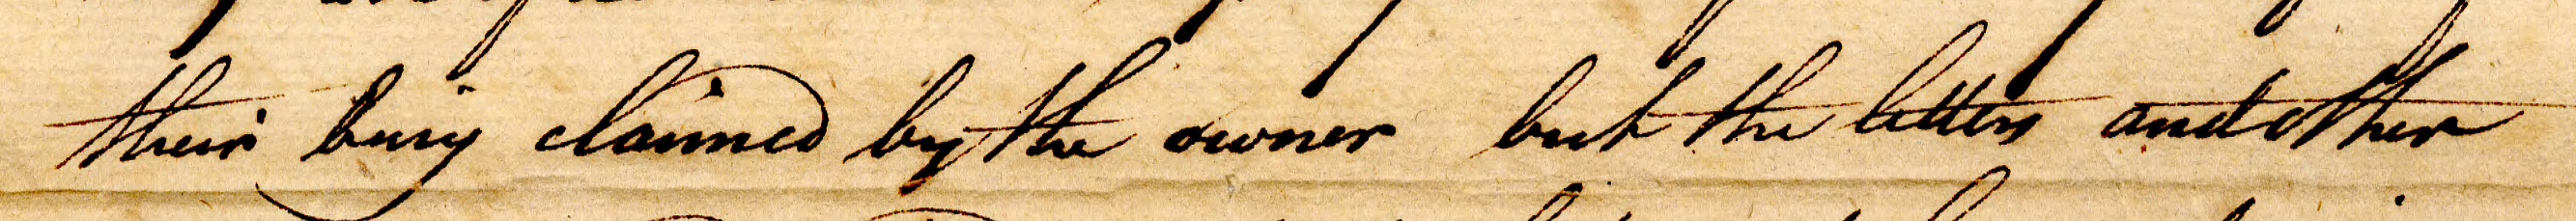their being claimed by the owner but the letters and other
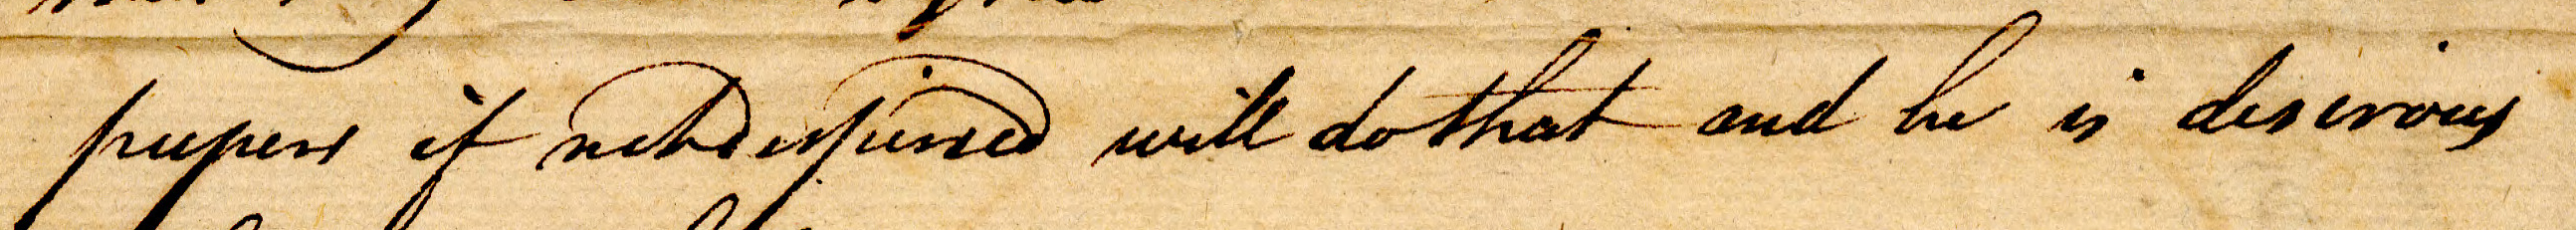papers if not disturbed to that and he is desirous
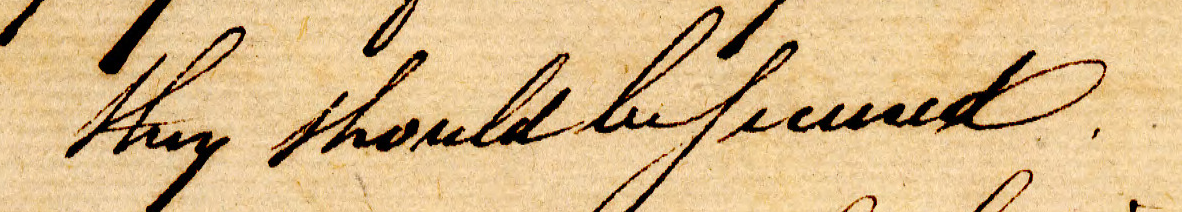they should be secured.
